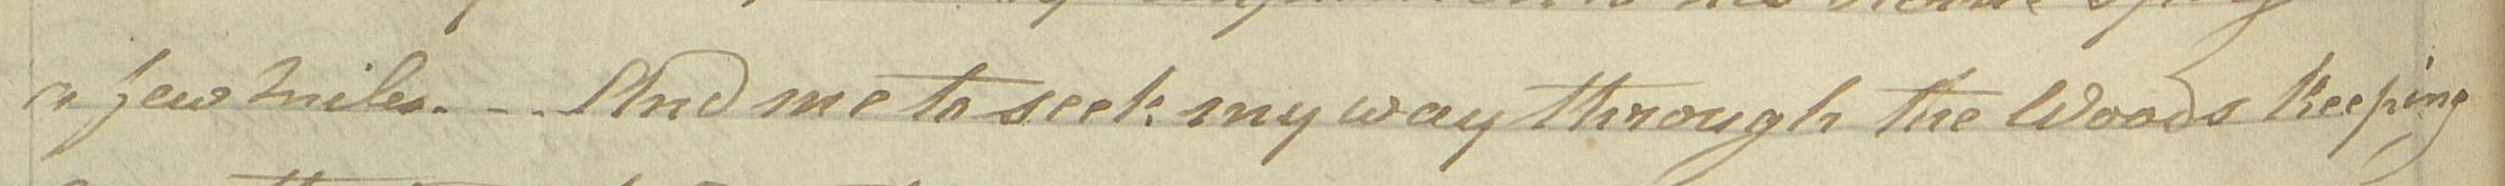a few miles. And me to seek my way through the Woods keeping
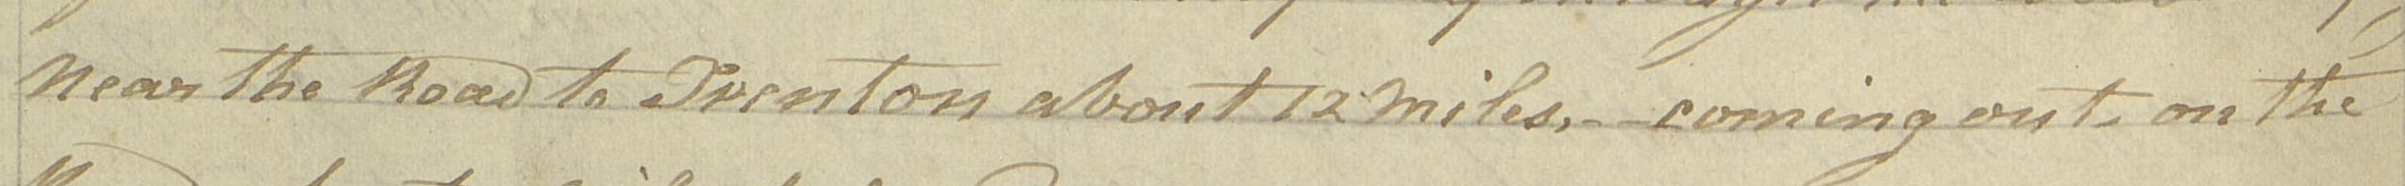Near the Road to Trenton about 12miles. coming out on the
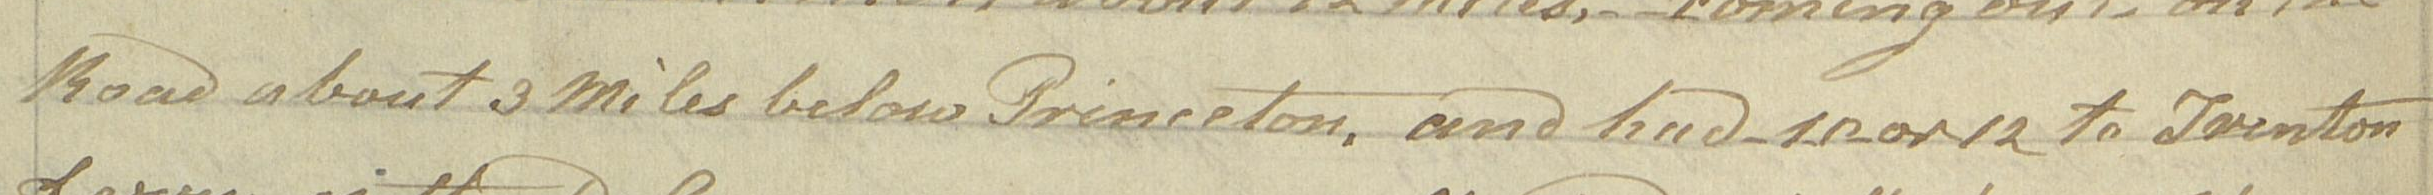Road about 3 Miles below Princeton, and had 11 or 12 to Trenton
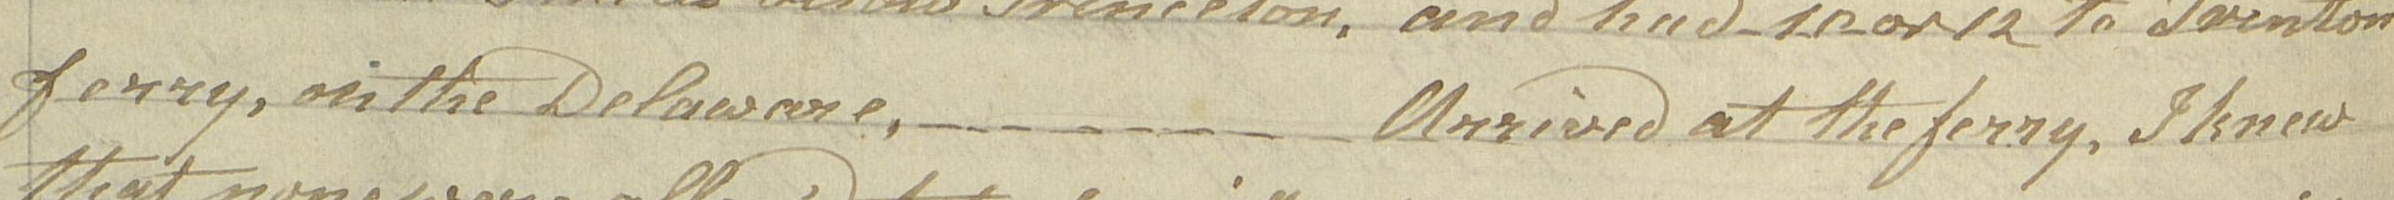ferry, on the Delaware, Arrived at the ferry, I knew
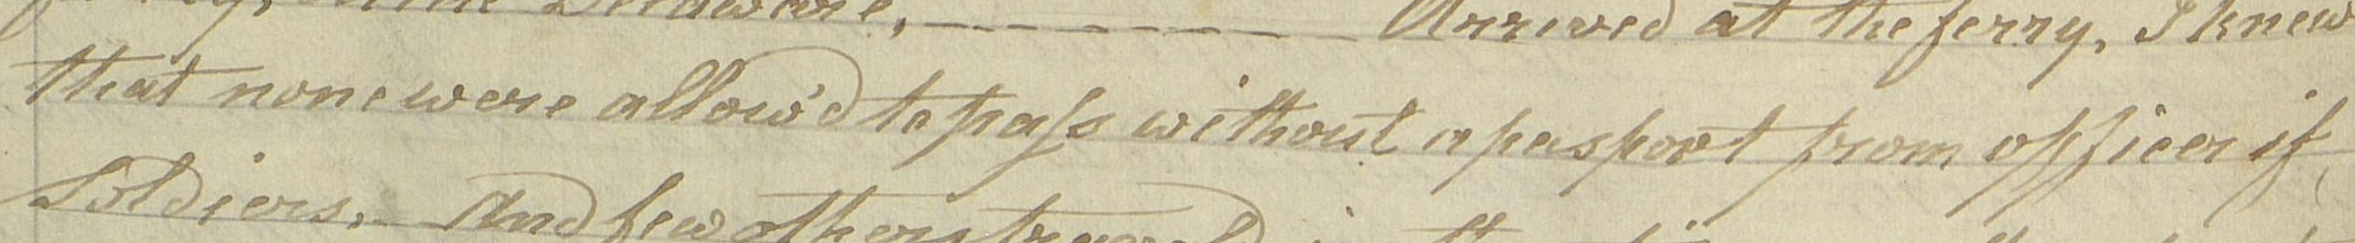that none were allow'd to pass without a pasport from officer if
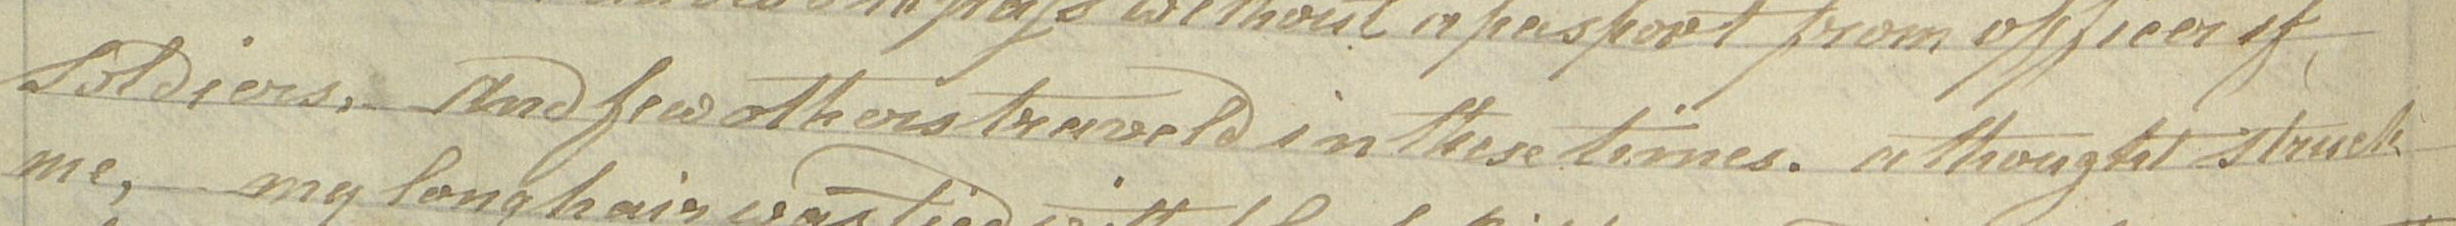Soldiers, And few others traveld in these times. a thought struck
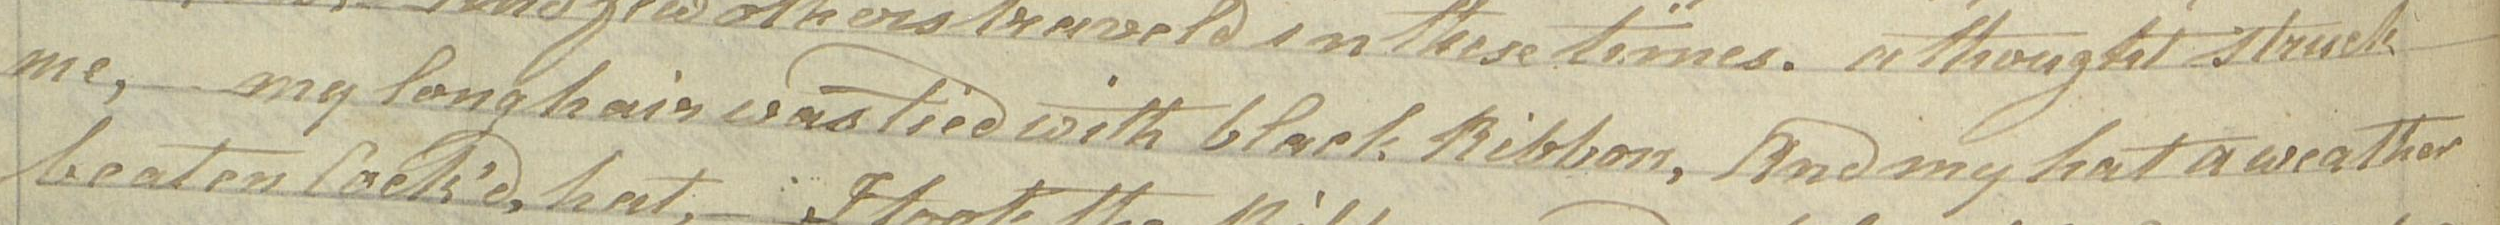me, my longhair wastied with black Ribbon, And my hat a weather
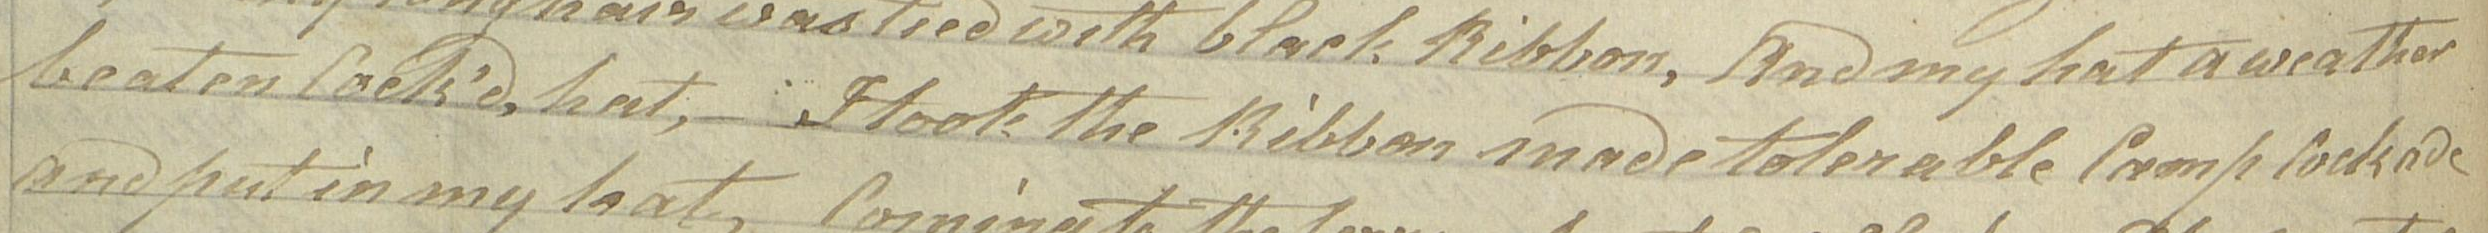beaten Cock'd hat, I took the Ribbon made tolerable Camp Cockade
